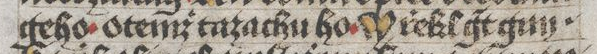geho.otemiž tazachu ho.Y ṙekl ḡt gim.
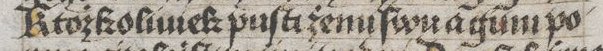Ktož koliuiek puſti żenu ſwu a jinu po¬
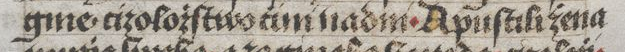gme.cizoložſwto ċini nadní.A puſtili żena
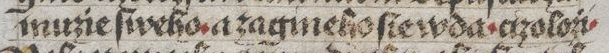mužie ſweko.a za gineho ſe wda.cizolożí
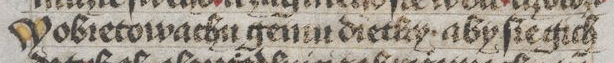Y obietovachu gemu dietkey.aby ẛie gich
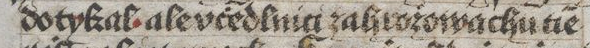dotykal.ale vċedlnici zahrožowachu tiē
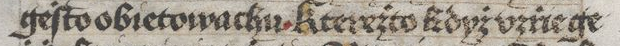geẛto obietowachu.Ktereżto když vzṙie ge¬
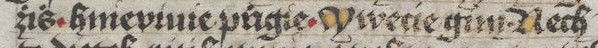żiṡ.hneviuie pṙigie.Y wecie gím.Nech¬
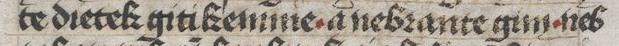te dietek giti kemnie.a nebrante gim.neb
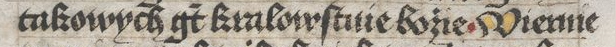takowých ḡt kralowſtuíe božie.Viernie
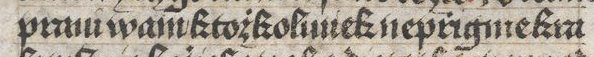praui wam ktoż koliuiek nepṙigme kra¬
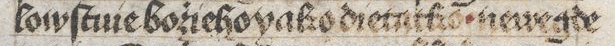lowſtuíe bożíeho yako díetako newegde
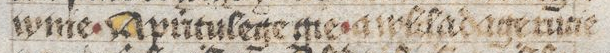w níe. A pritulege ge a.xý.Ki ſ
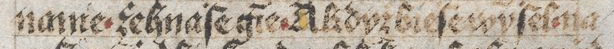na níe žehnaẛe gie. A kdyż bíeſe wyſel na
